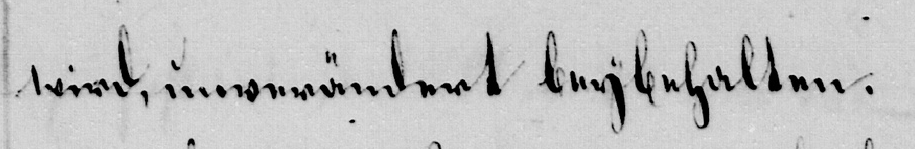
wird, unverändert beybehalten.
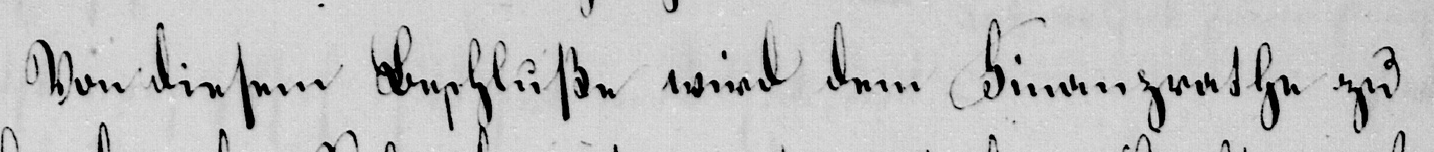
Von diesem Beschluße wird dem Finanzrathe zu
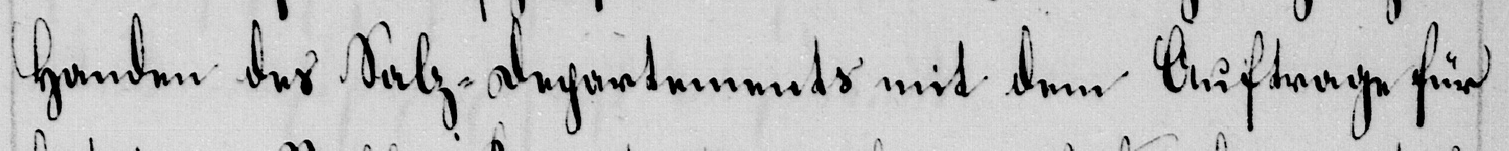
Handen des Salz-Departements mit dem Auftrage für
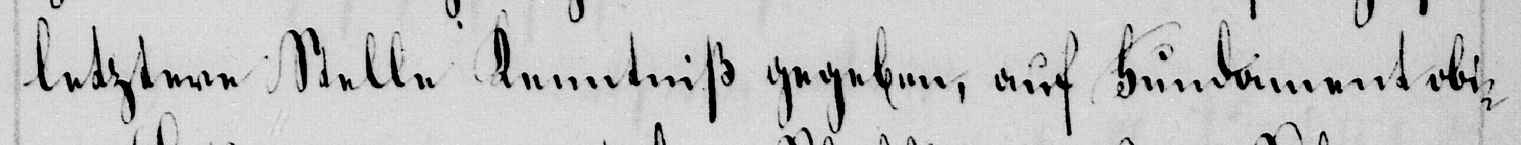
letztere Stelle Kenntniß gegeben, auf Fundament obi¬
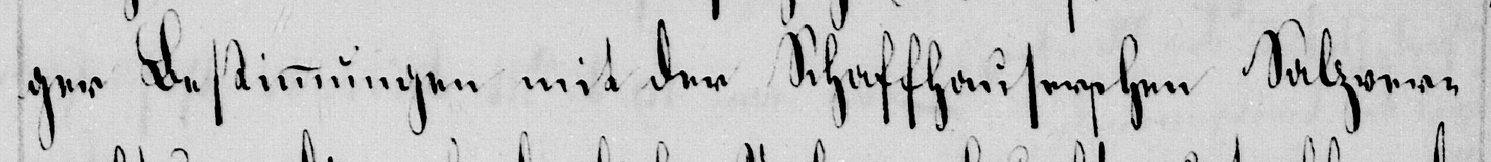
ger Bestimmungen mit der Schaffhauserschen Salzver¬
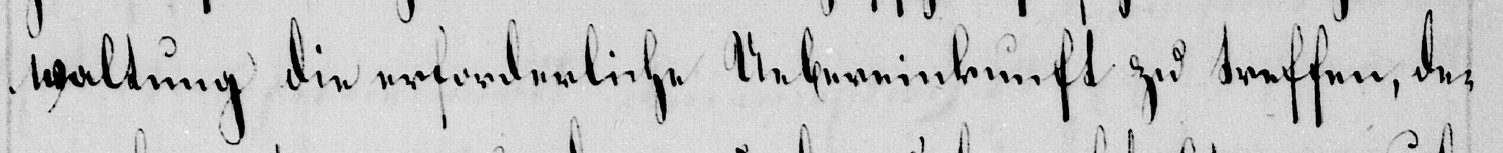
waltung die erforderliche Uebereinkunft zu treffen, de¬
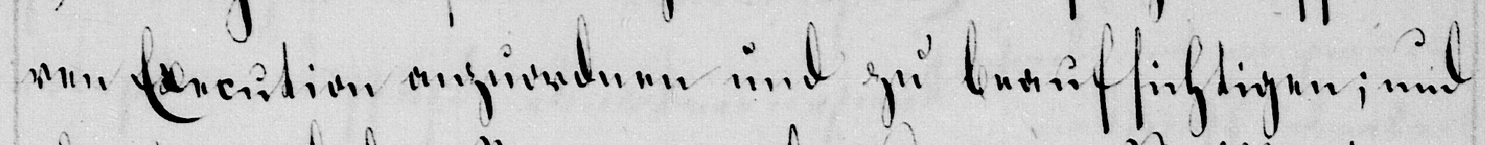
ren Execution anzuordnen und zu beaufsichtigen; und
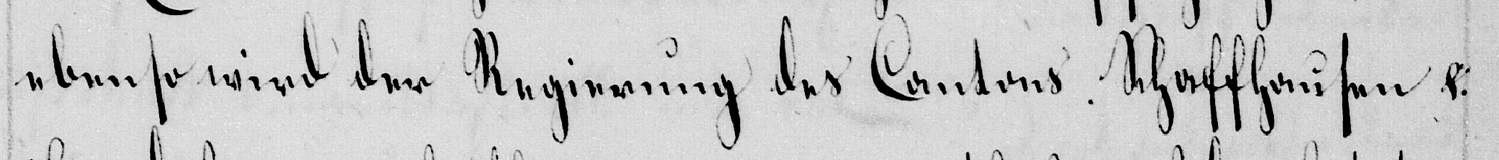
ebenso wird der Regierung des Cantons Schaffhausen &
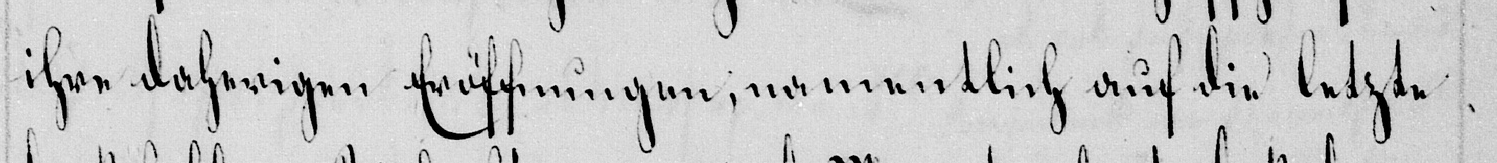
ihre daherigen Eröffnungen, namentlich auf die letzte
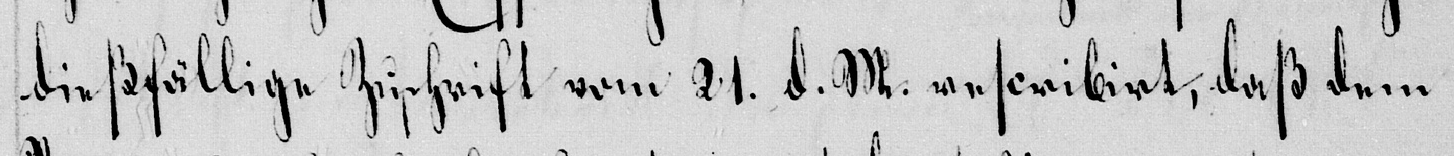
dießfällige Zuschrift vom 21. d. M. rescribirt, daß dem
